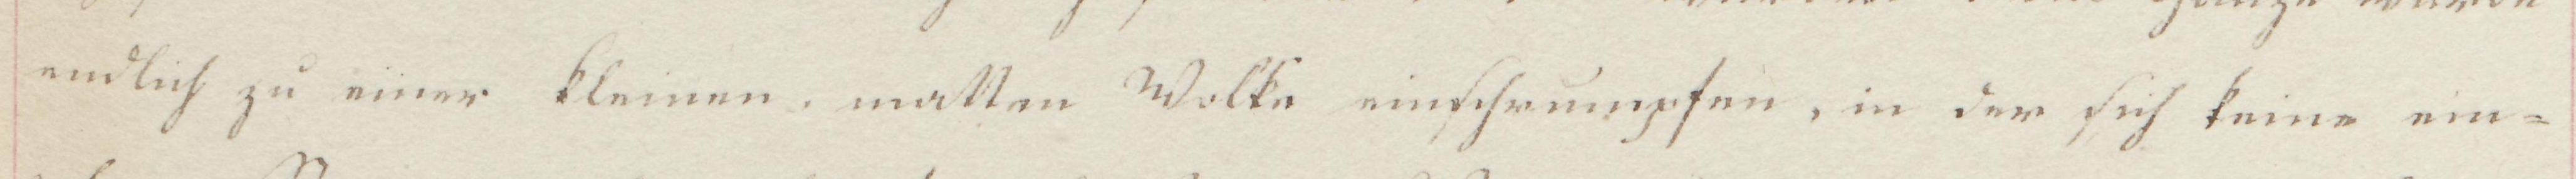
endlich zu einer kleinen, matten Wolke einschrumpfen, in der sich keine ein-
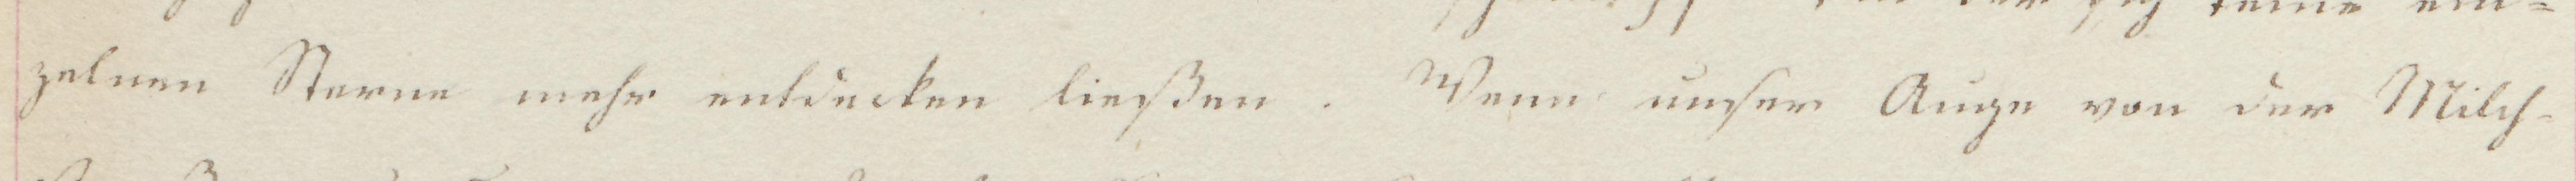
zelnen Sterne mehr entdecken ließen. Wenn unser Auge von der Milch-
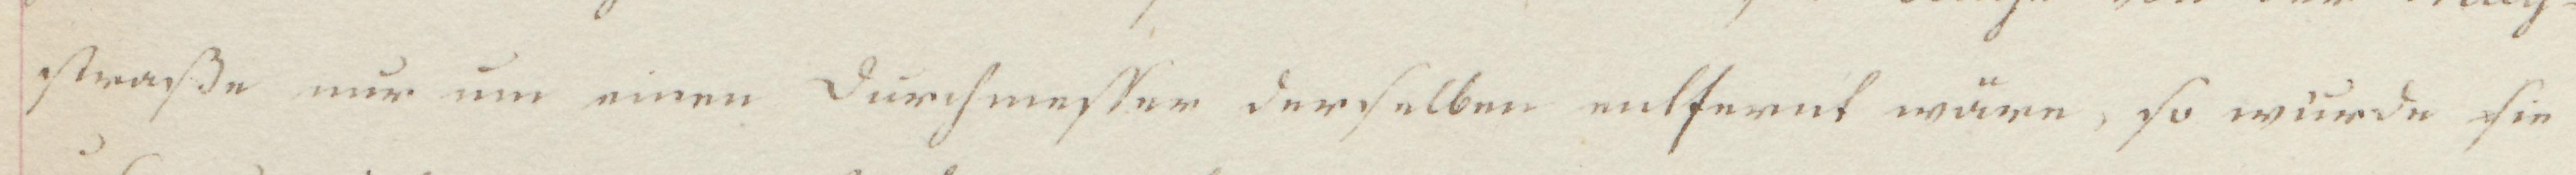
straße nur um einen Durchmesser derselben entfernt wäre, so würde sie
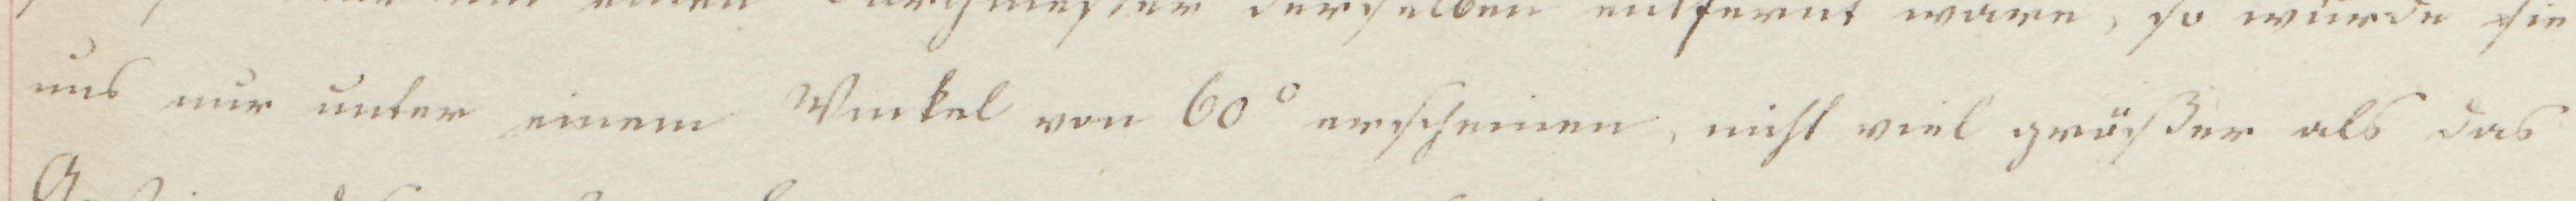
uns nur unter einem Winkel von 60° erscheinen, nicht viel größer als das
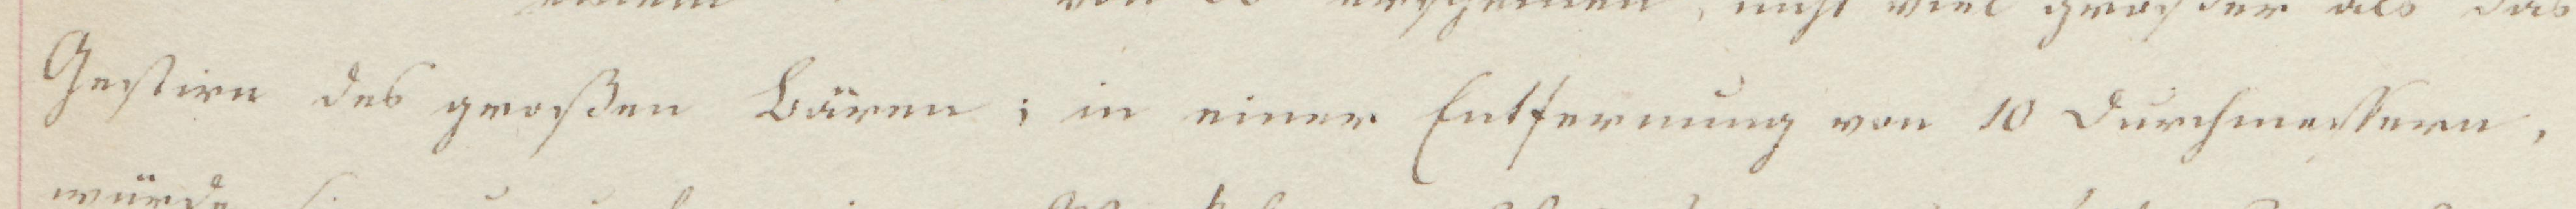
Gestirn des großen Bären; in einer Entfernung von 10 Durchmessern,
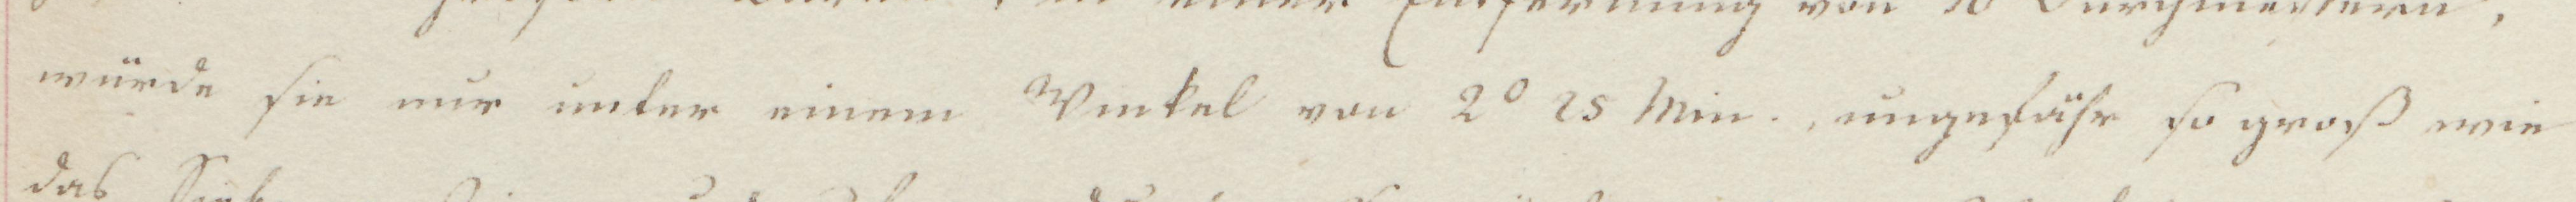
würde sie nur unter einem Winkel von 2° 25 Min., ungefähr so groß wie
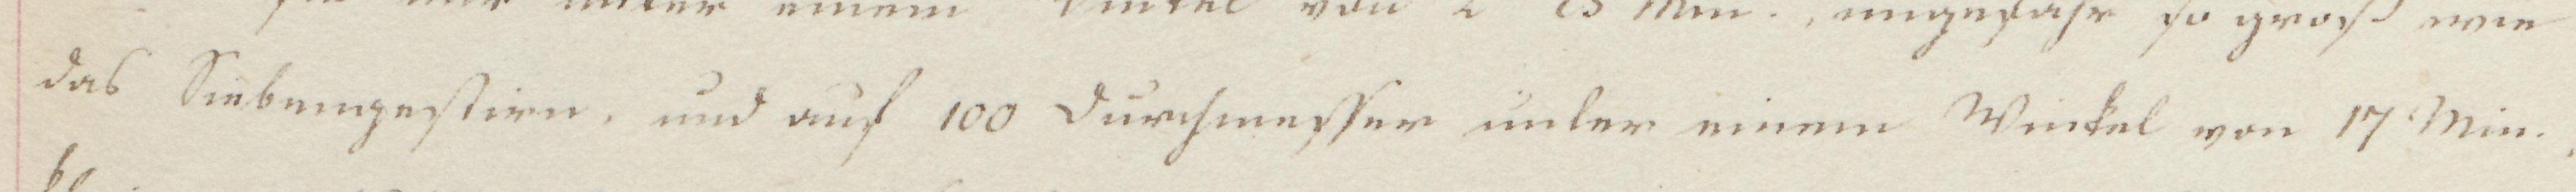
das Siebengestirn, und auf 100 Durchmesser unter einem Winkel von 17 Min.,
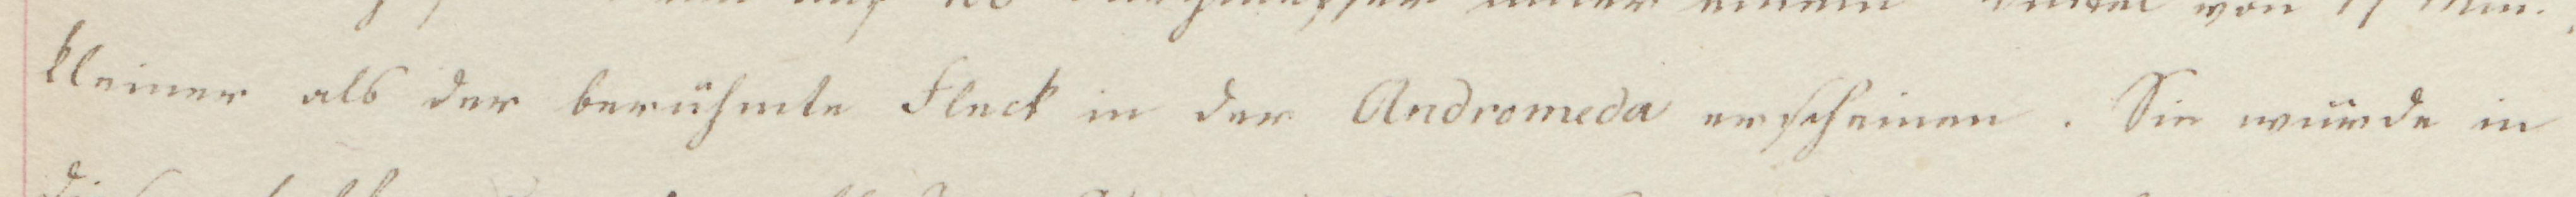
kleiner als der berühmte Fleck in der Andromeda erscheinen. Sie würde in
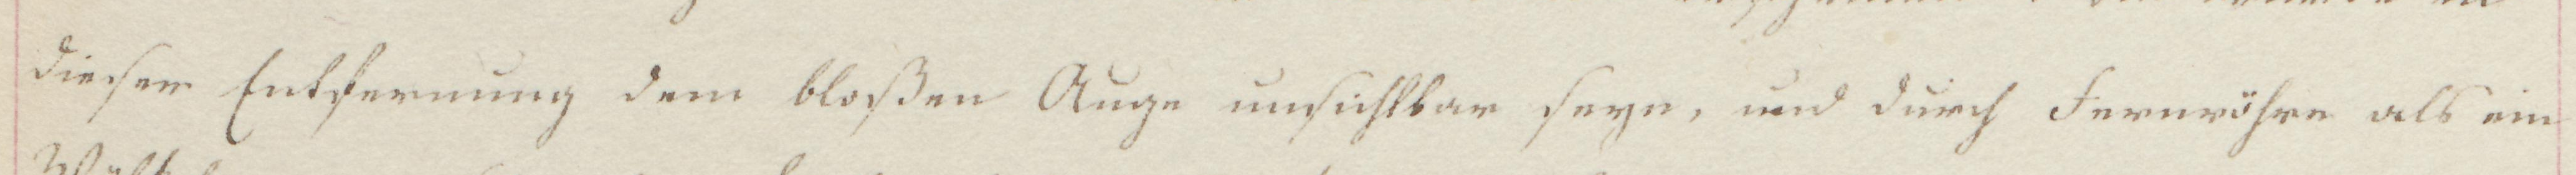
dieser Entfernung dem bloßen Auge unsichtbar seyn, und durch Fernröhre als ein
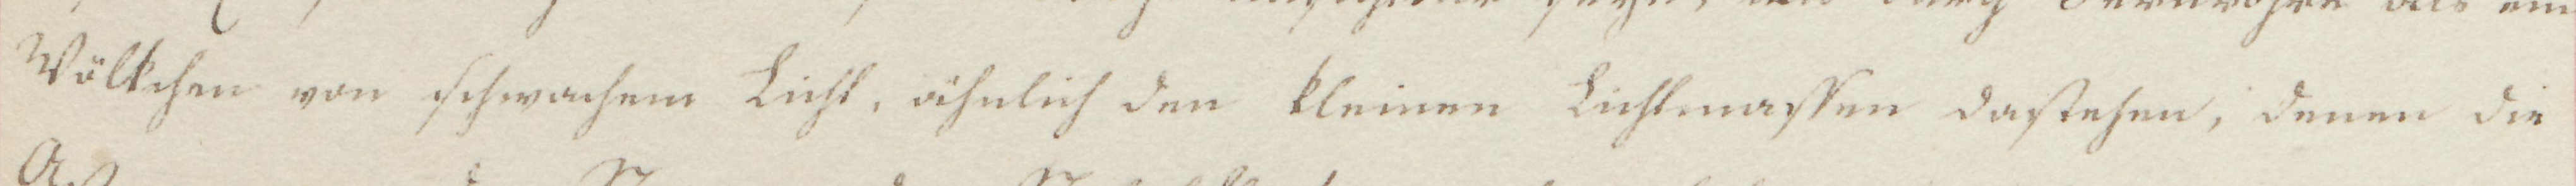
Wölkchen von schwachem Licht, ähnlich den kleinen Lichtmassen dastehen, denen die
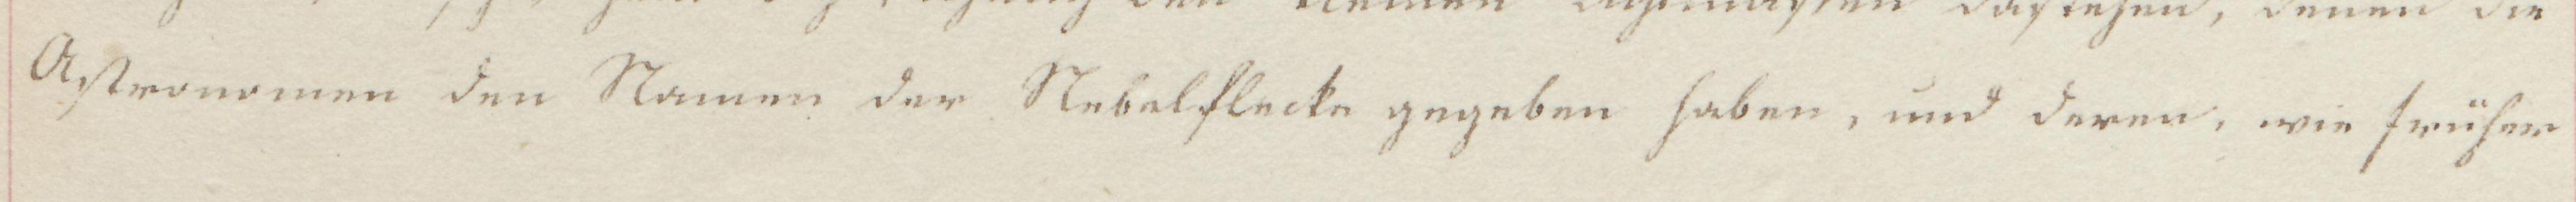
Astronomen den Namen der Nebelflecke gegeben haben, und deren, wie früher
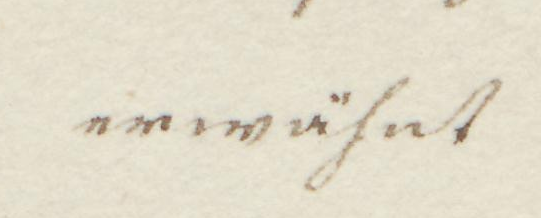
erwähnt
